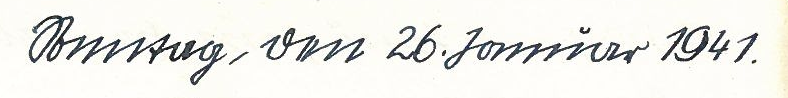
Sonntag, den 26. Januar 1941.
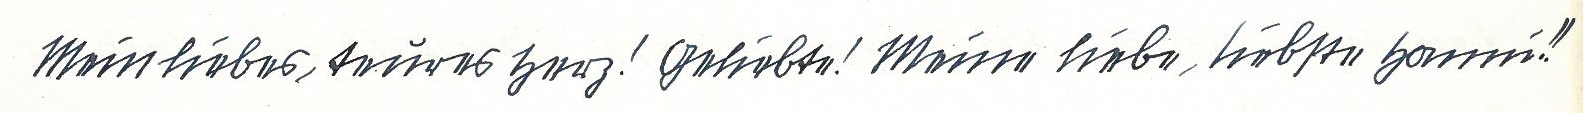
Mein liebes, teures Herz! Geliebte! Meine liebe, liebste Hilde!!
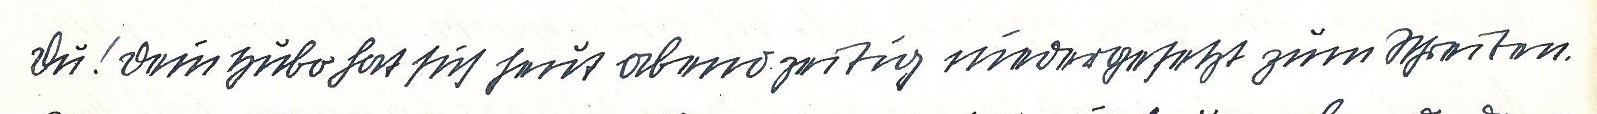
Du! Dein Hubo hat sich heut abend zeitig niedergesetzt zum Schreiben.
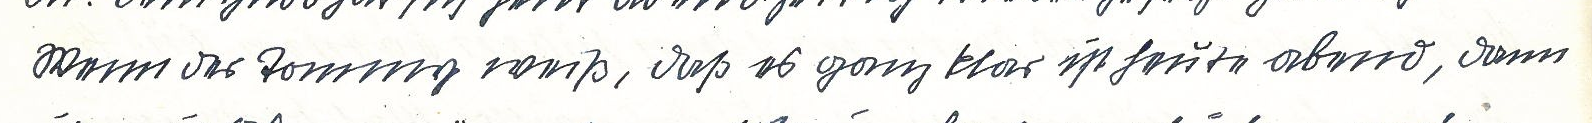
Wenn der Tommy weiß, daß es ganz klar ist heute abend, dann
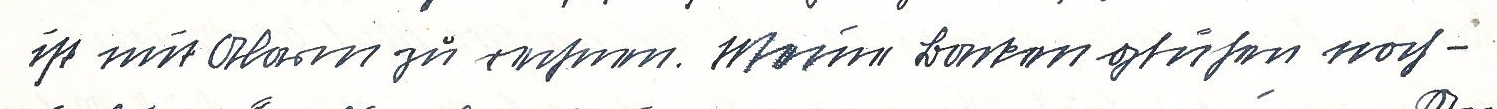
ist mit Alarm zu rechnen. Meine Backen glühen noch –
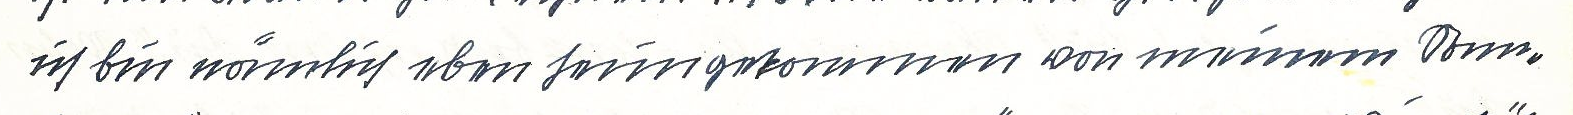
ich bin nämlich eben heimgekommen von meinem Sonn¬
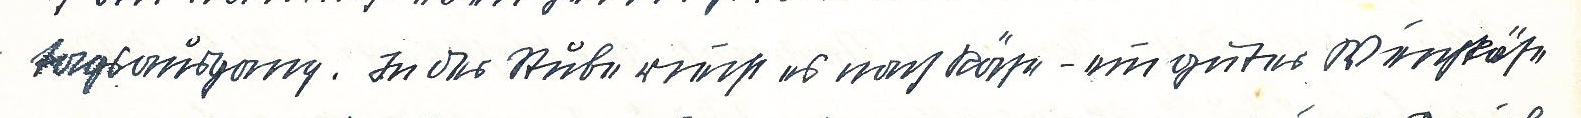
tagsausgang. In der Stube riecht es nach Käse – ein guter Weichkäse
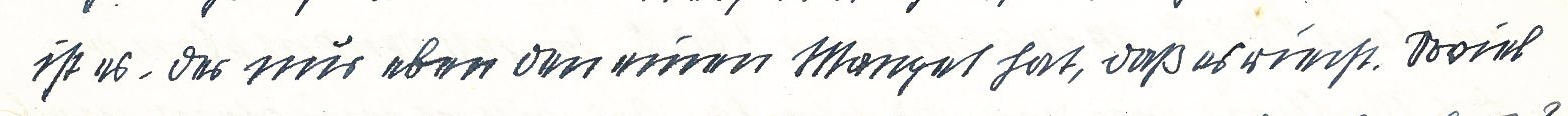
ist es, der nur eben den einen Mangel hat, daß er riecht. Soviel
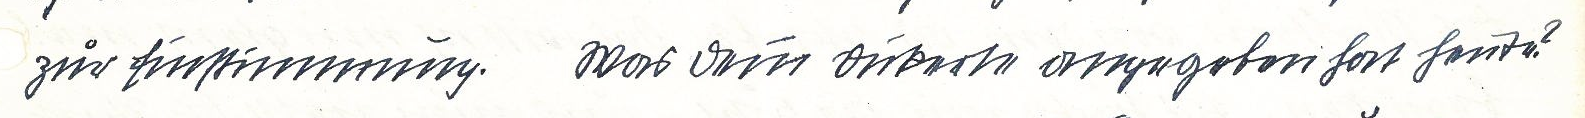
zur Einstimmung. Was Dein Dickerle angegeben hat heute?
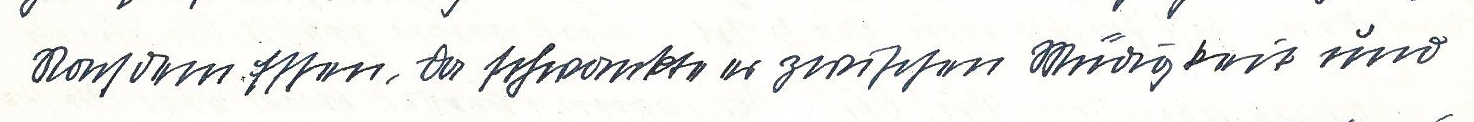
Nach dem Essen, da schwankte er zwischen Müdigkeit und
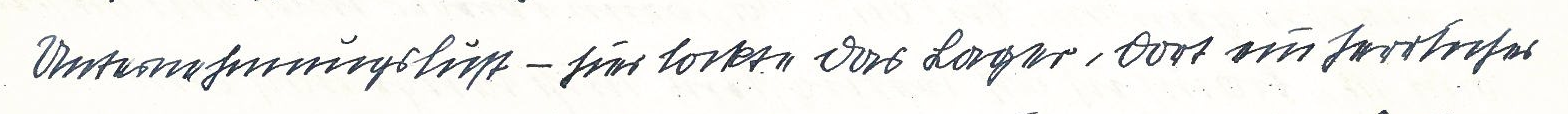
Unternehmungslust – hier lockte das Lager, dort ein herrlicher
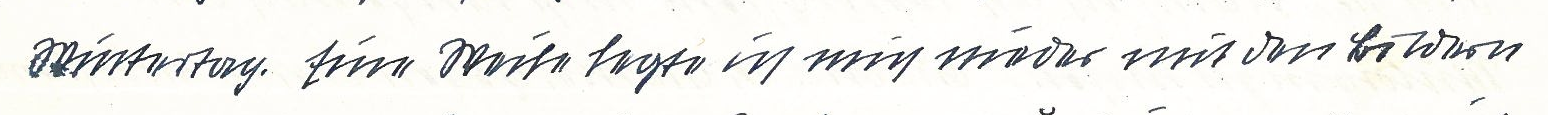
Wintertag. Eine Weile legte ich mich nieder mit den Bildern
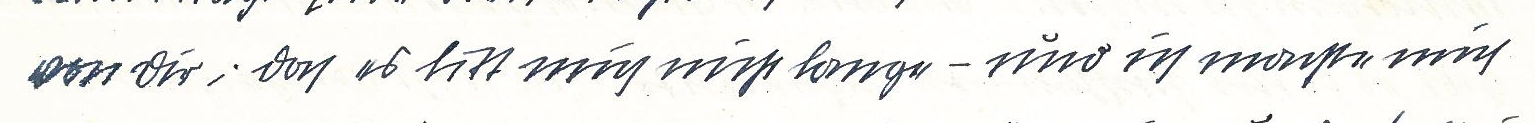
von Dir; doch es litt mich nicht lange – und ich machte mich
